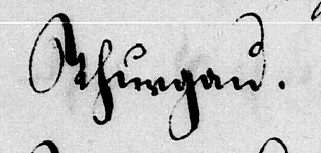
Thurgau.
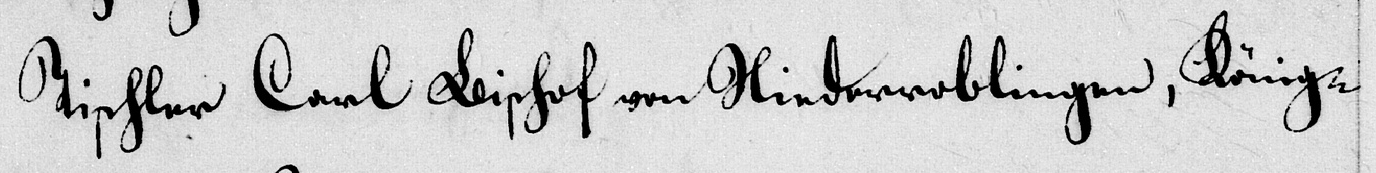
Tischler Carl Bischof von Niederroblingen, König¬
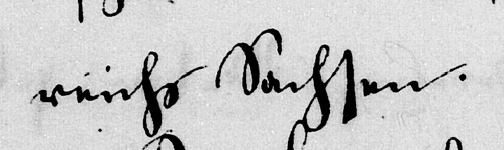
reichs Sachsen.
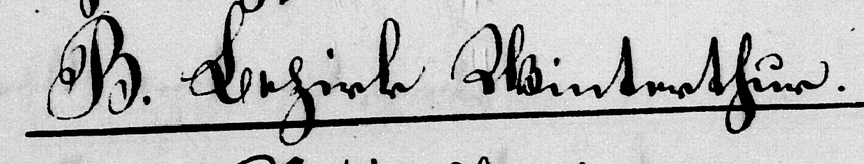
B. Bezirk Winterthur.
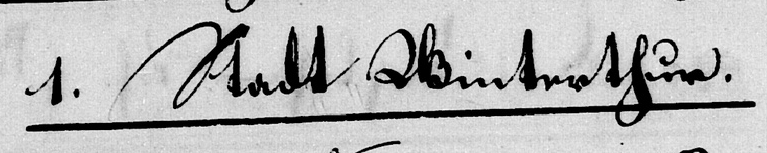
1. Stadt Winterthur.
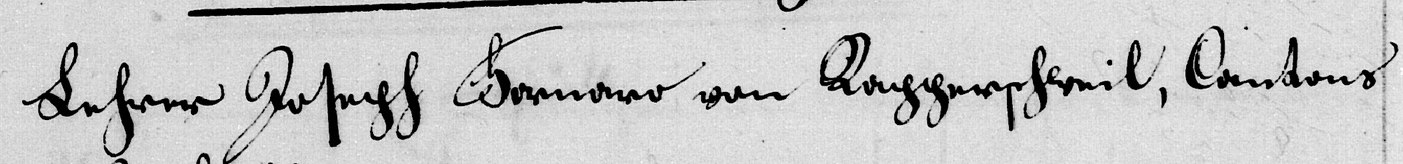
Lehrer Joseph Fornaro von Rapperschweil, Cantons
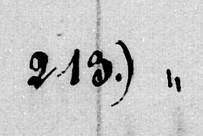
215.) “
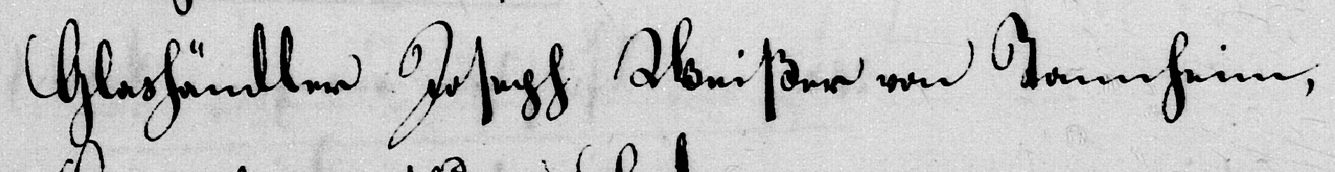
Glashändler Joseph Weißer von Tannheim,
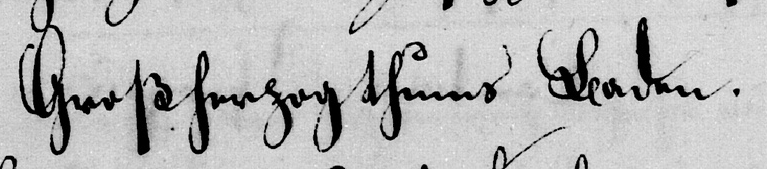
Großherzogthums Baden.
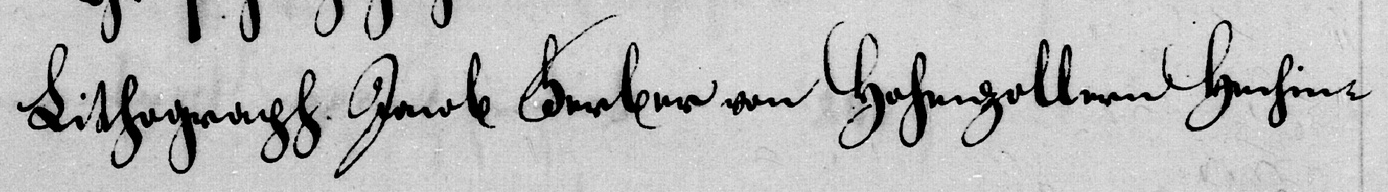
Lithograph Jacob Ferber von Hohenzollern Hechin¬
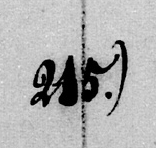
212.)
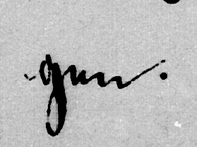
gen.
